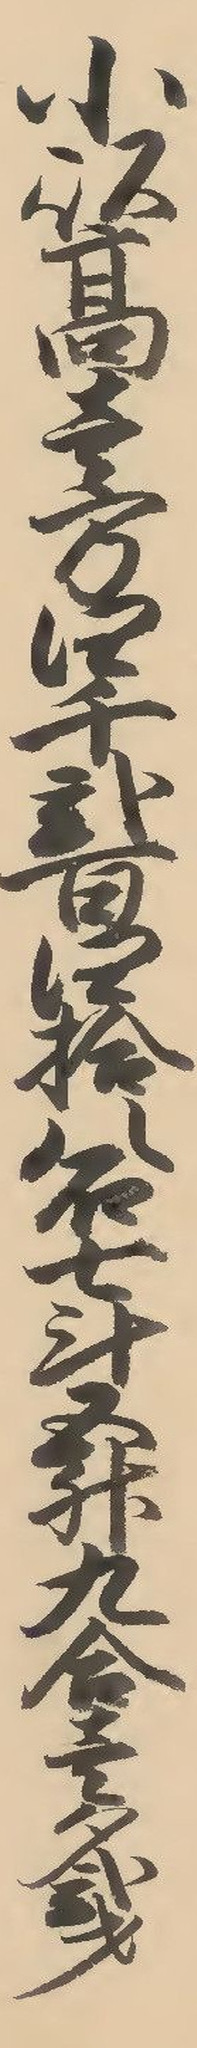小以高壱万四千弐百四拾八石七斗五升九合壱勺武才

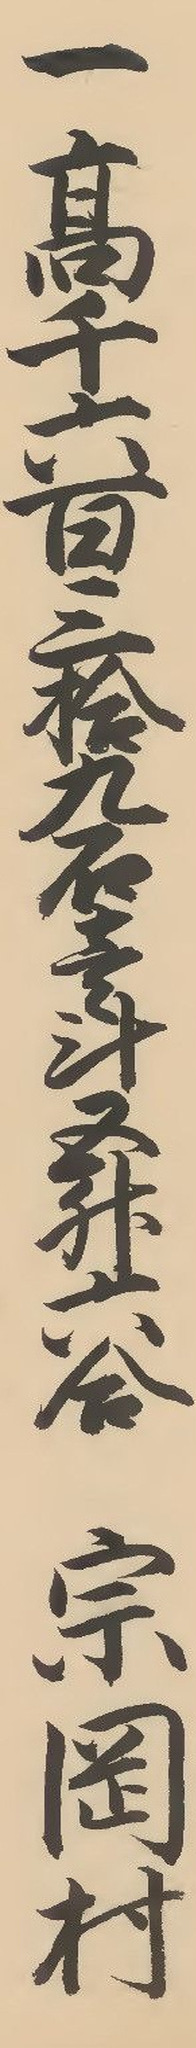一高千六百三拾九石壱斗五升六合宗岡村
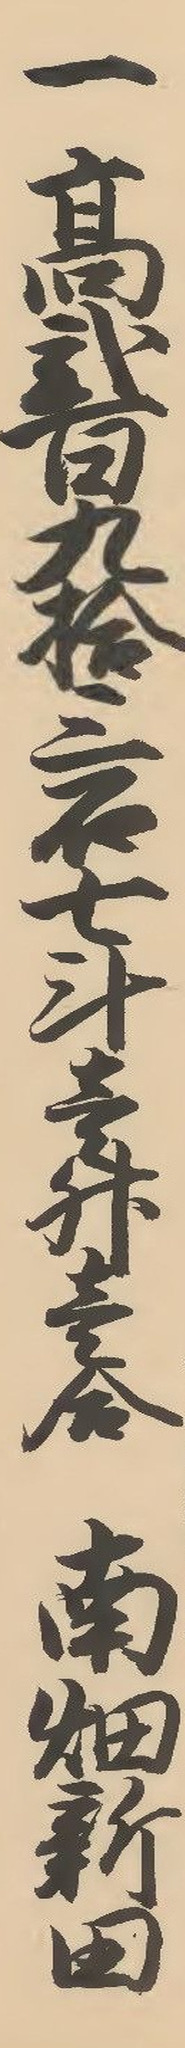一高弐百九拾三石七斗壱升壱合南畑新田
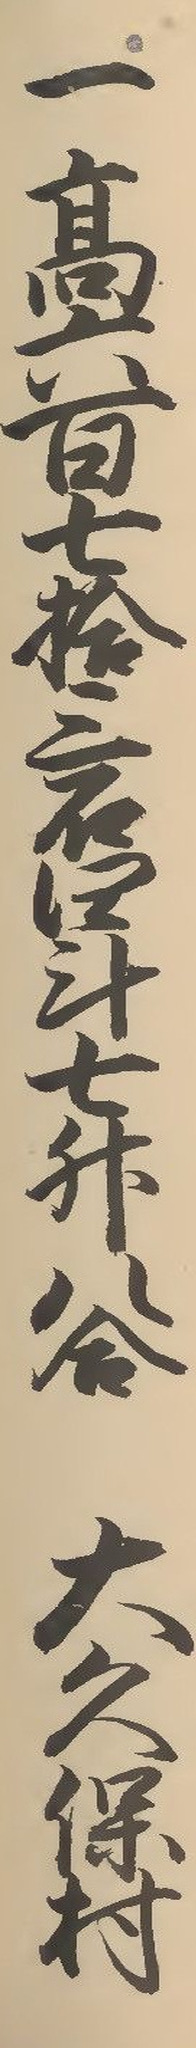一高六百七拾三石四斗七升八合大久保村
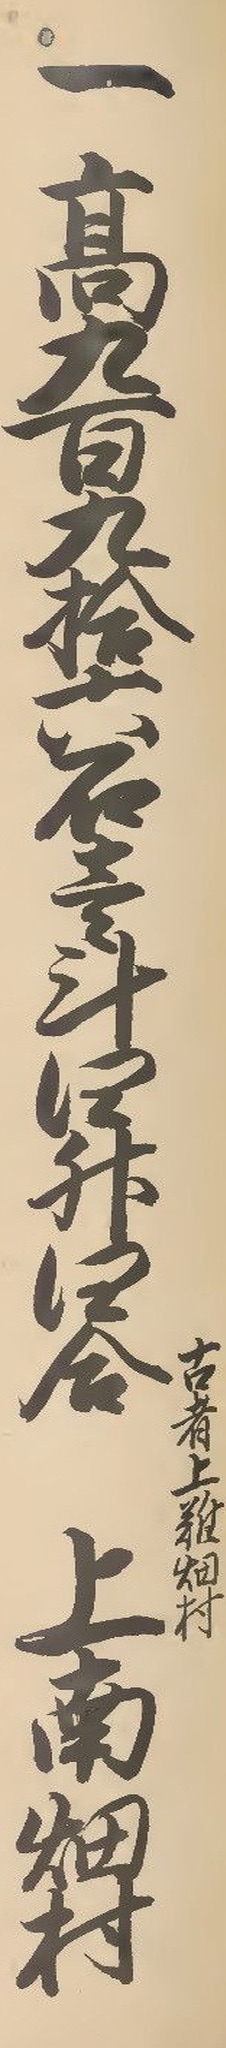一高九百九拾六石壱斗四升四合上南畑村
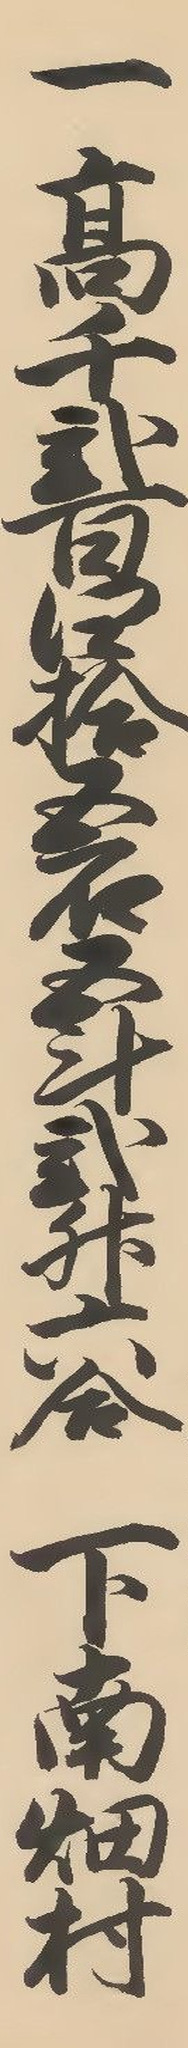一高千弐百四拾五石五斗弐升六合下南畑村
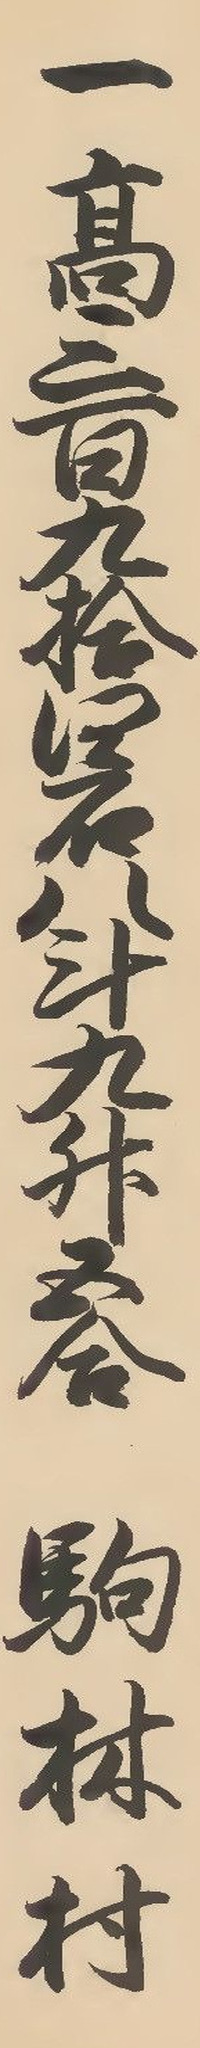一高三百九拾四石八斗九升五合駒林村
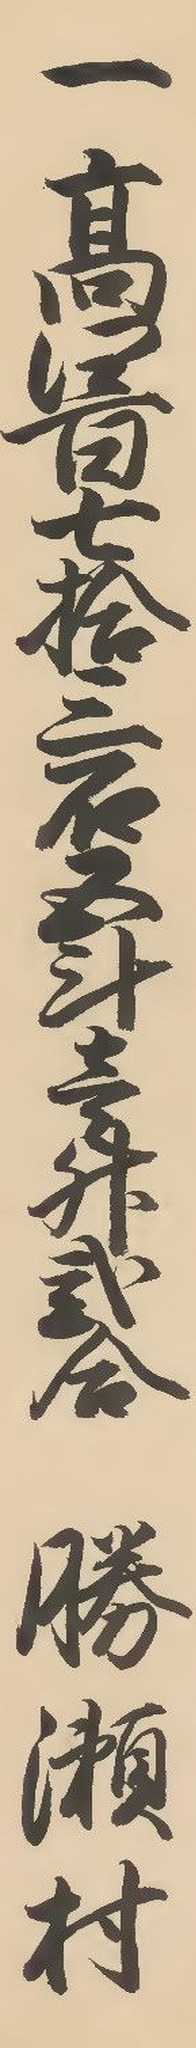一高四百七拾三石五斗壱升弐合勝瀬村

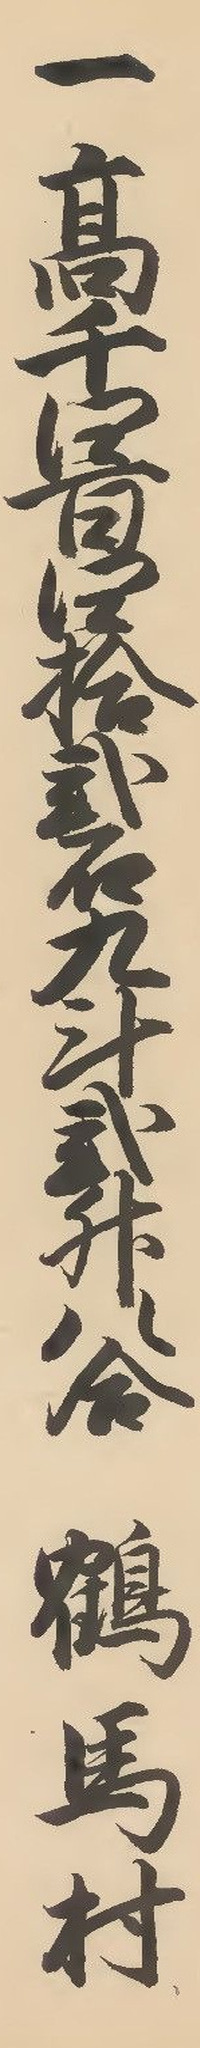一高千四百四拾弐石九斗弐升八合鶴馬村
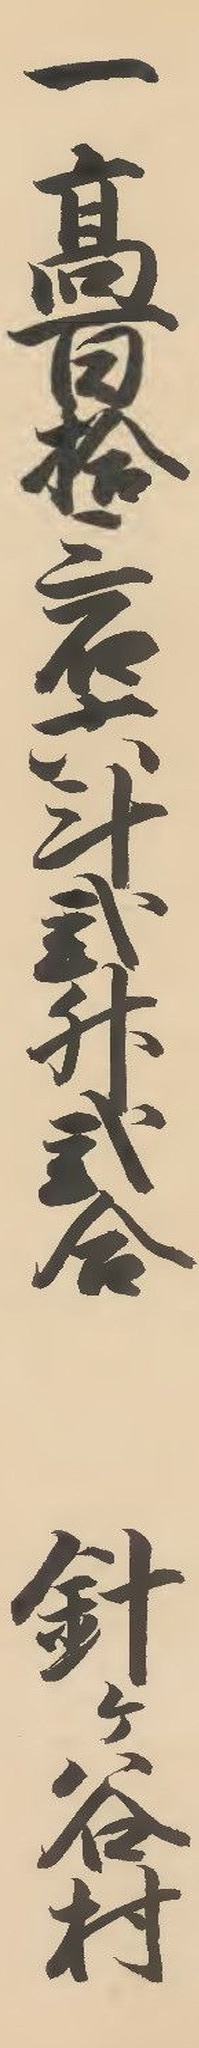一高百拾三石六斗弐升弐合針ヶ谷村
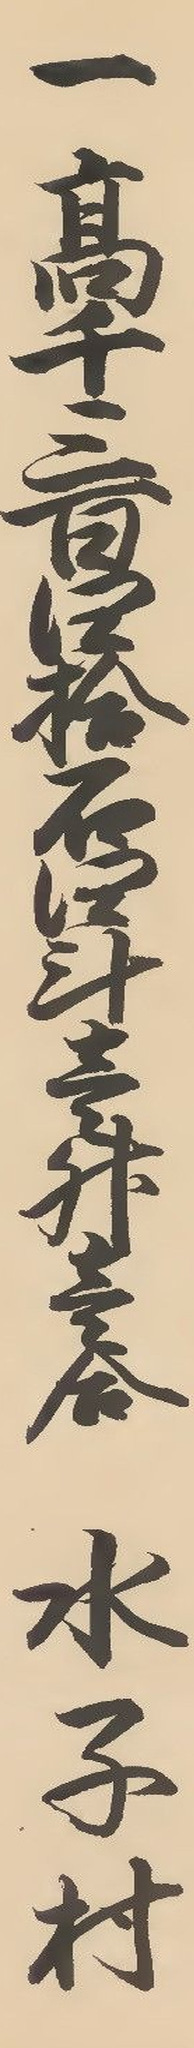一高千三百四拾石四斗壱升壱合水子村
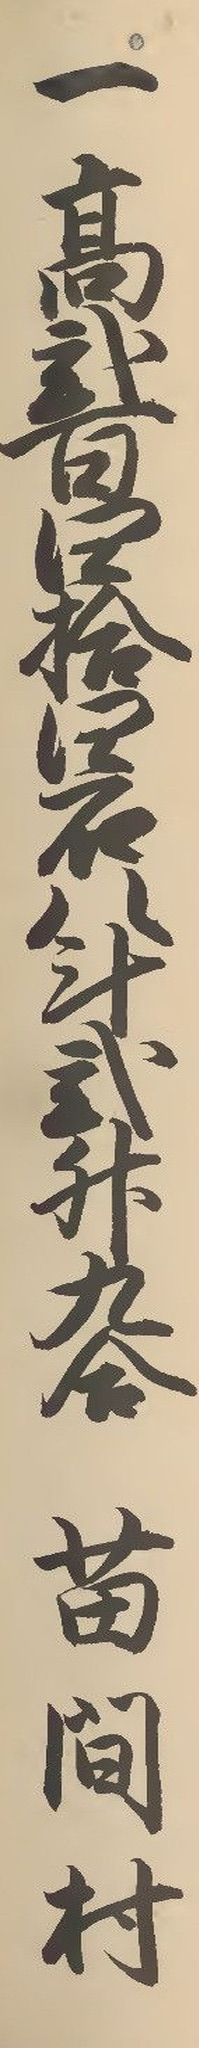一高弐百四拾四石八斗弐升九合苗間村
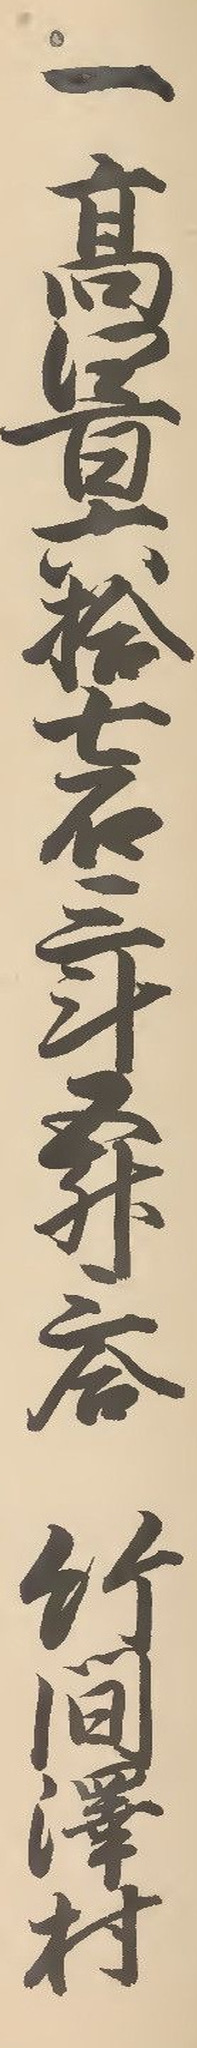一高四百六拾七石三斗五升三合竹間澤村
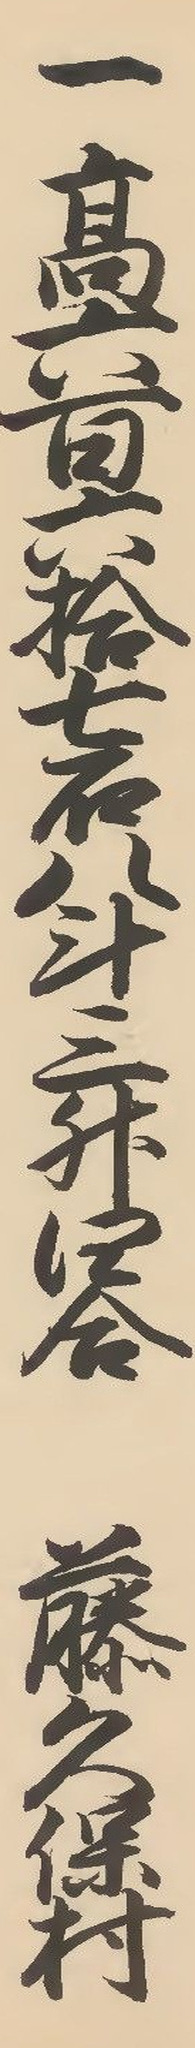一高六百六拾七石八斗三升四合藤久保村
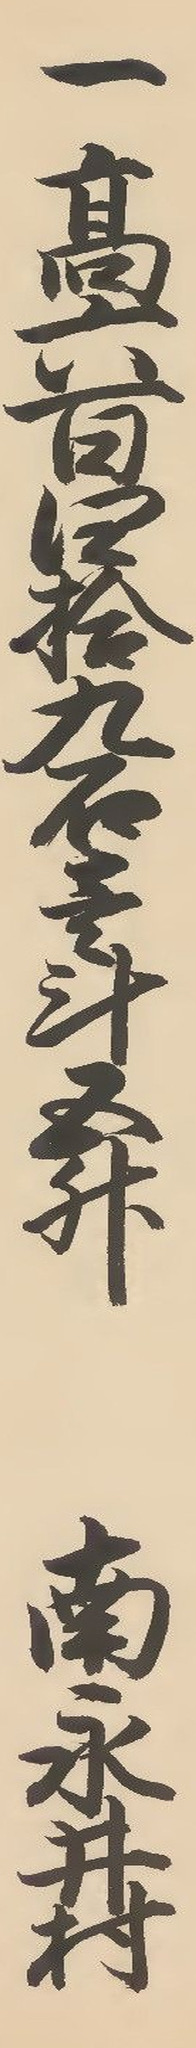一高六百四拾九石壱斗五升南永井村
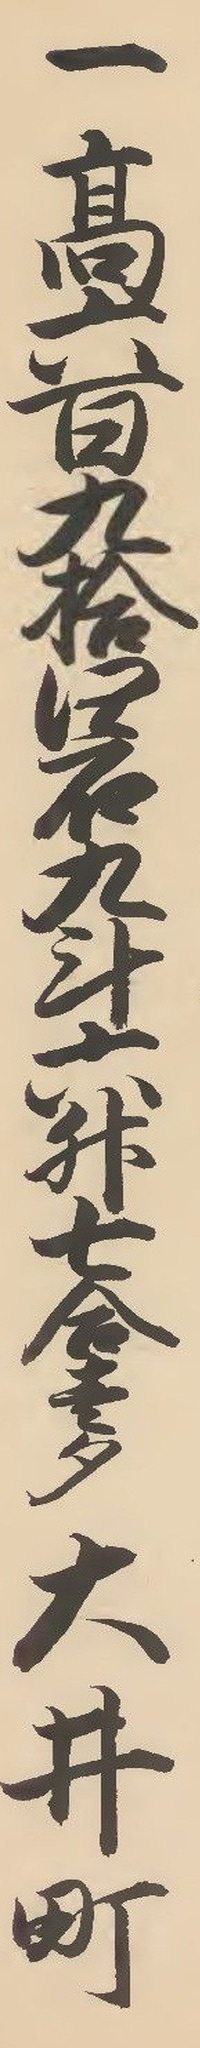一高六百九拾四石九斗六升七合壱勺大井町
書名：武蔵国郷帳　上
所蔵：国立公文書館 National Archives of Japan
